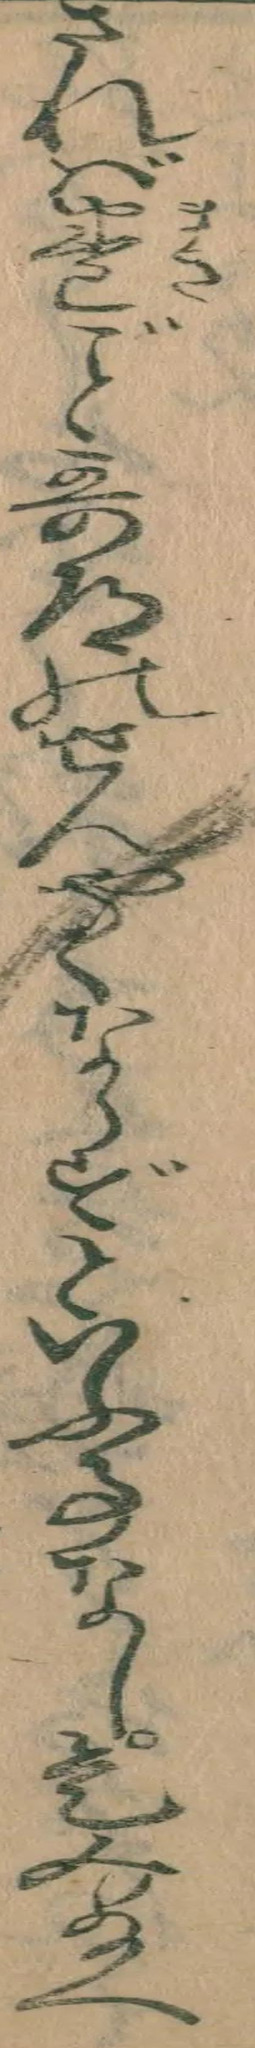されば巻ごと歌道のせんやくならずといふ事なし。是み給へ
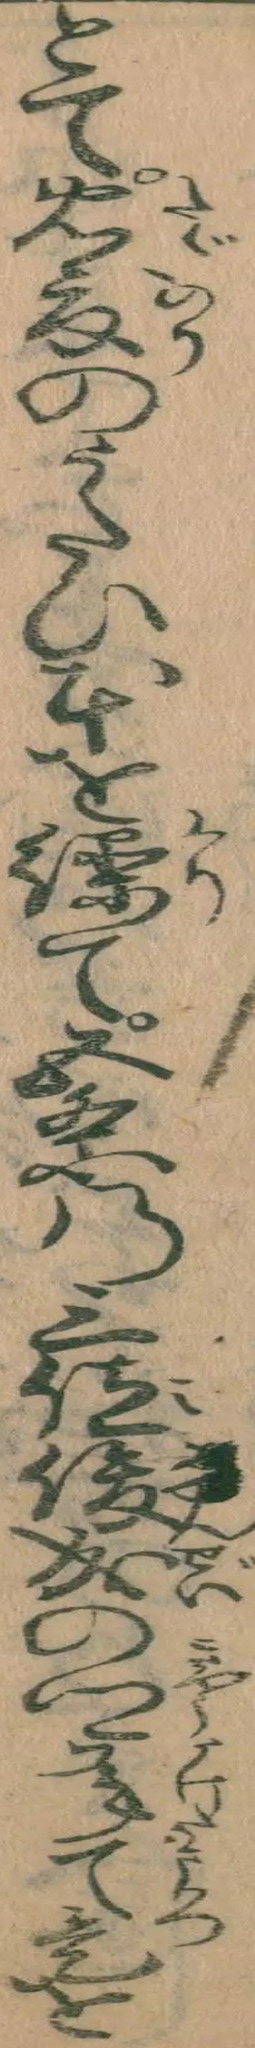とて。忠度のうたひ本を繰て。五条の三位俊成の卿承て是を
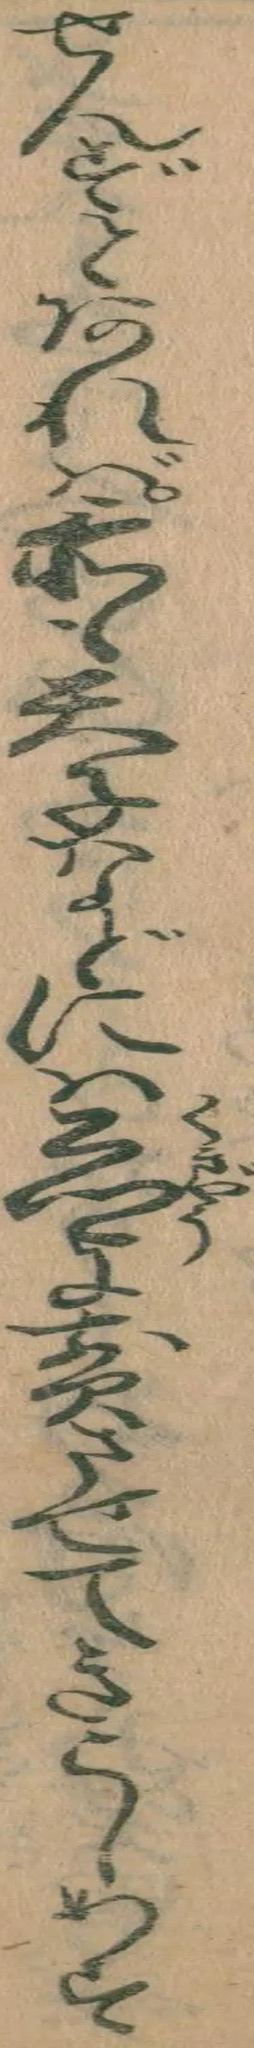せんずとあれば。忝も天子などには公卿に煎させてきこしめす
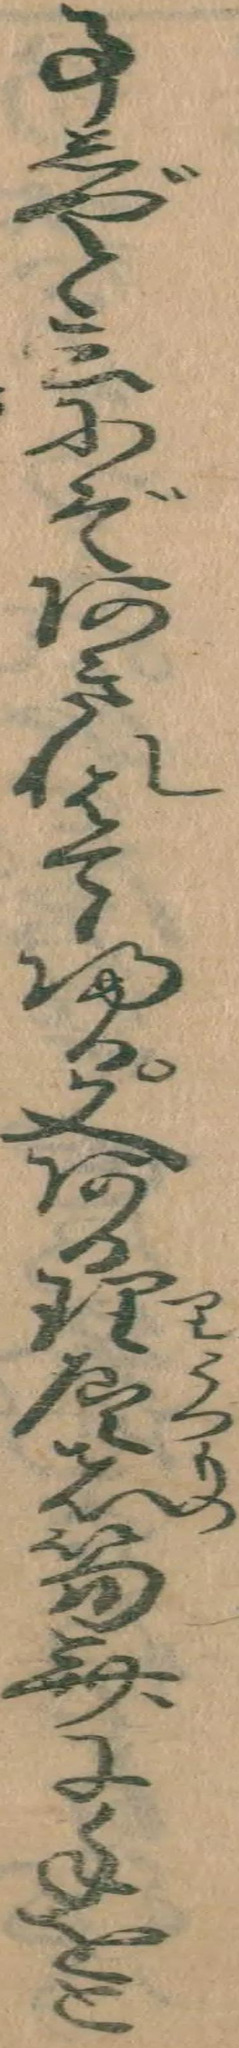事じやと云にぞあきれはてゝ帰る。又ある理尽者筍斎に手をと
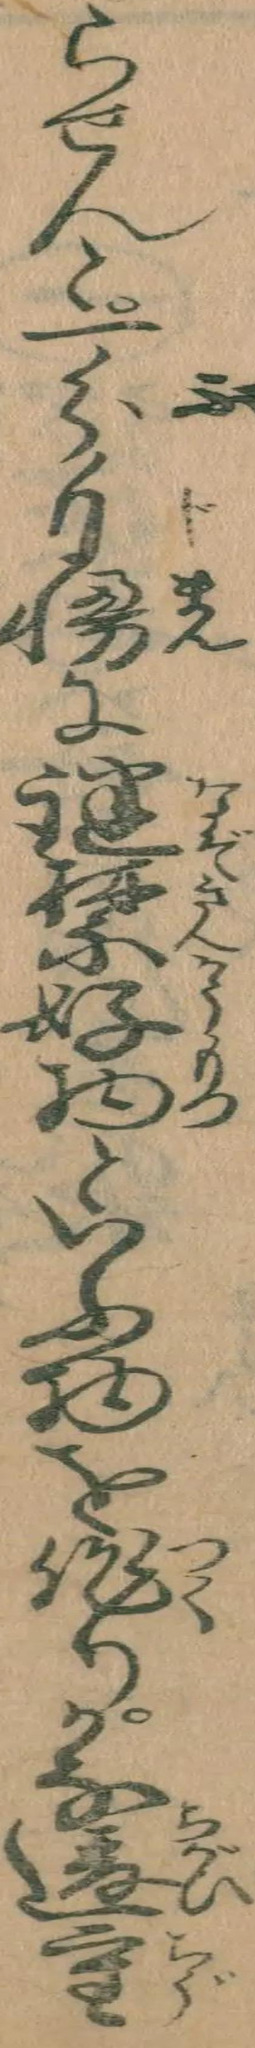らせんと。一分自慢に謎禁好物といふ物を作り。かな違重
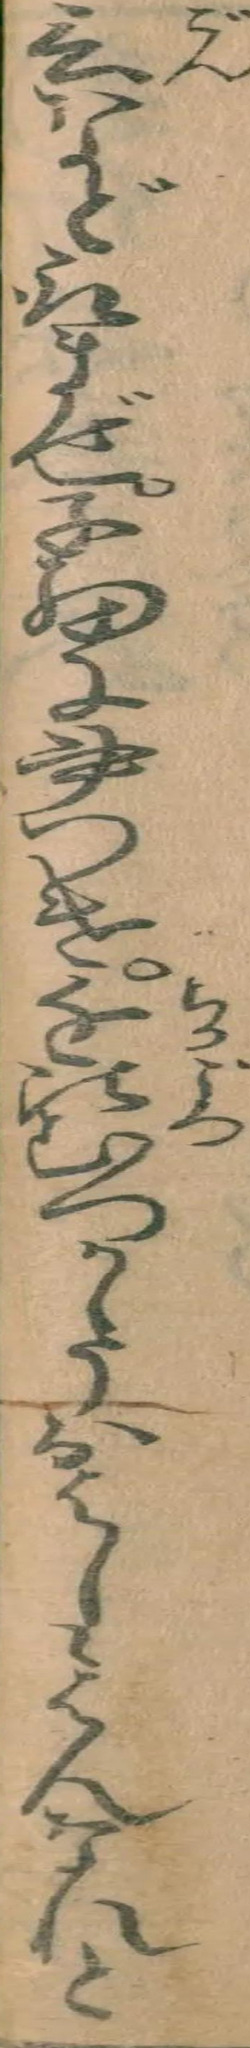言など取まぜ。子細に書つけ。近比むつかしうおはし候はんなれと
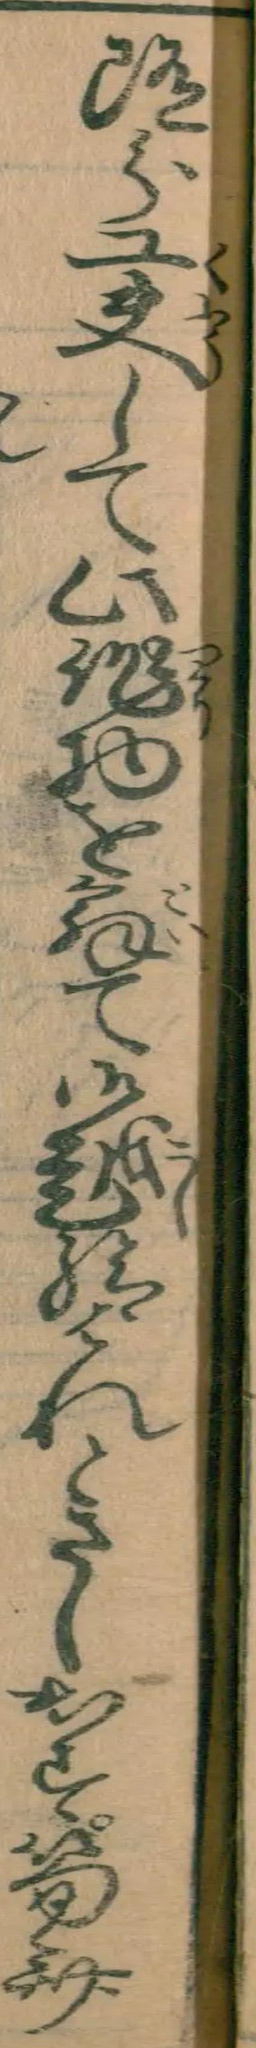随分工夫して此作物を解て御越給はれとさし出す。筍斎
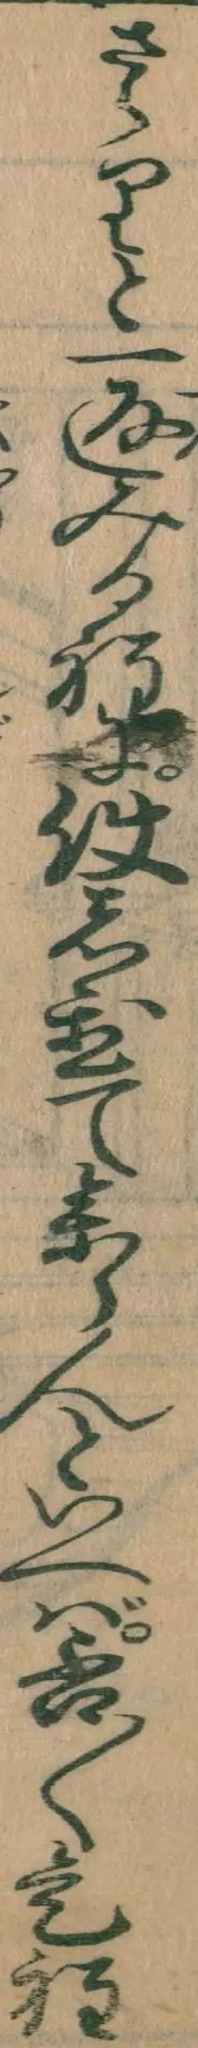さらりと一返みる程に。使者置て参らんといへば。否々是程
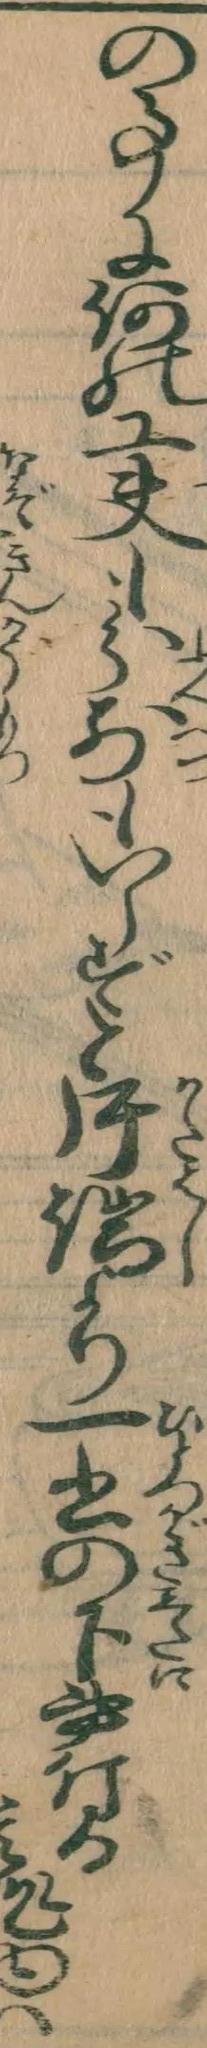の事に何の工夫も分別もいらずと片端より一書の下に書付る其作物は
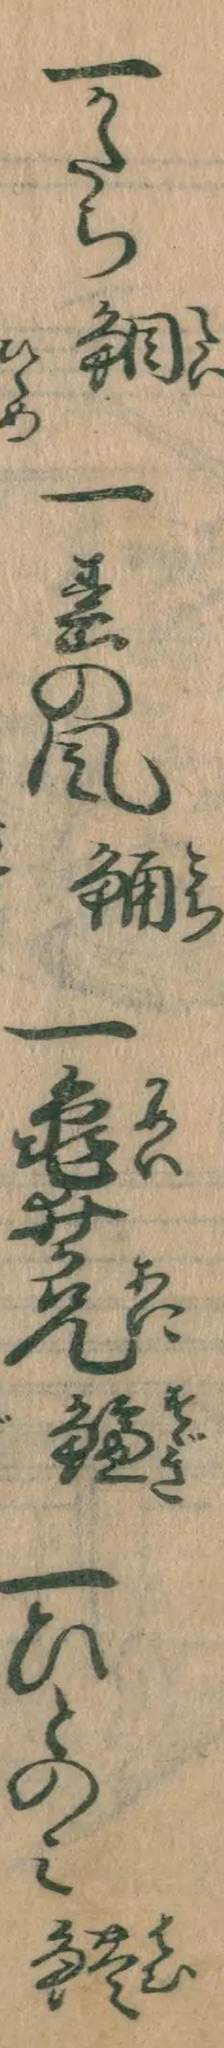一かたち鯛一春の風鯒一亀井か兄鱸一ひとのみ鱧
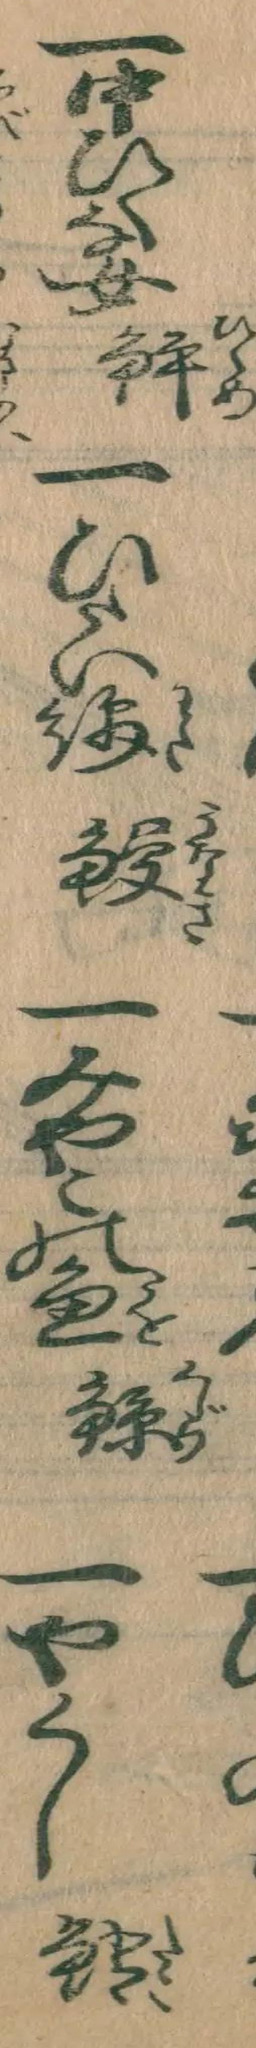一中ひくな女鮃一ひたい綿鰻一みやこの魚鯨一やくし鮹

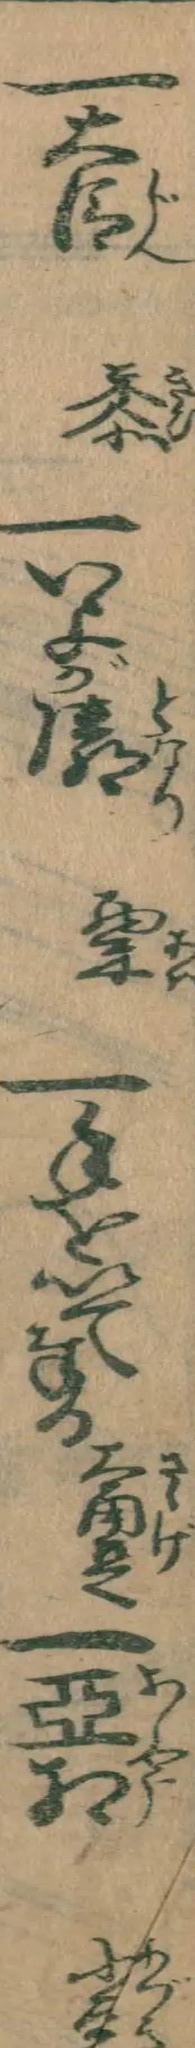一大臣黍一いよが隣粟一手を以て奉る大角豆一悪相小豆
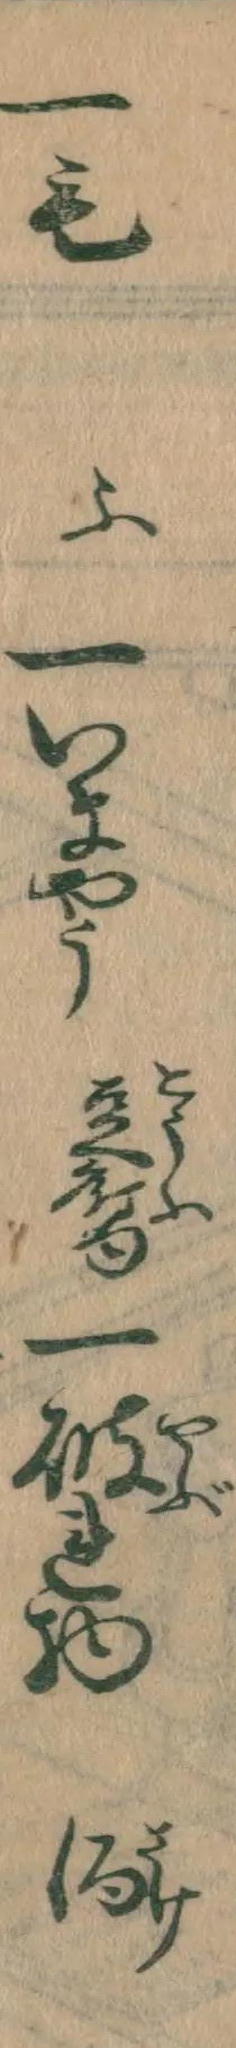一毛ふ一いまやう豆腐一破れ物酒
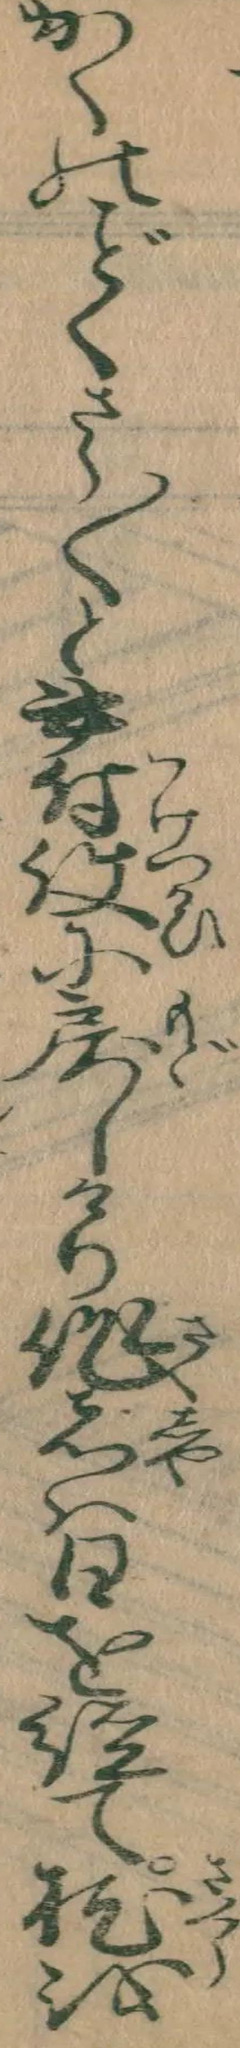かくのごとくさら〳〵と書付使に戾しけり作者は日を経て。枕を
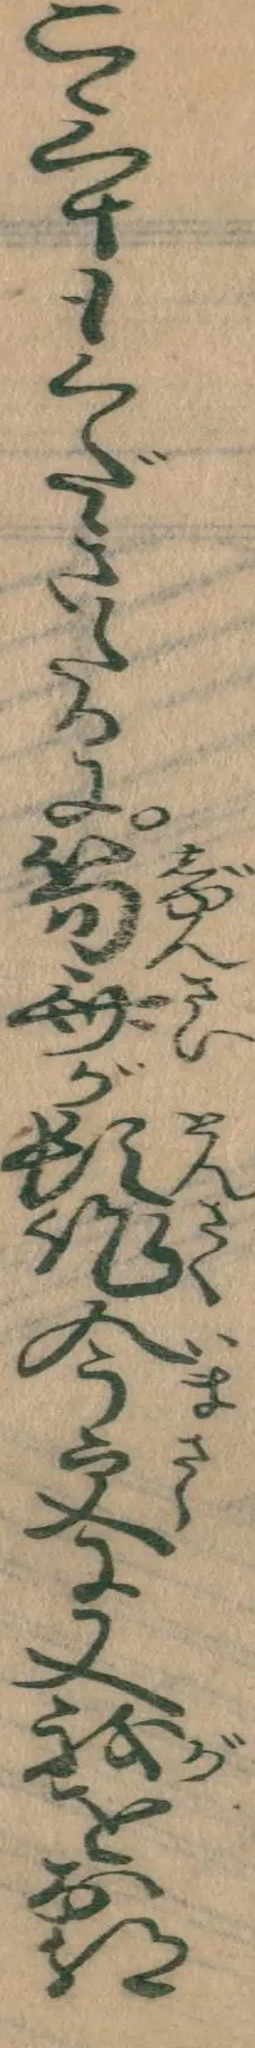二三十もくだきたるに。筍斎が頓作今更に又我をおる
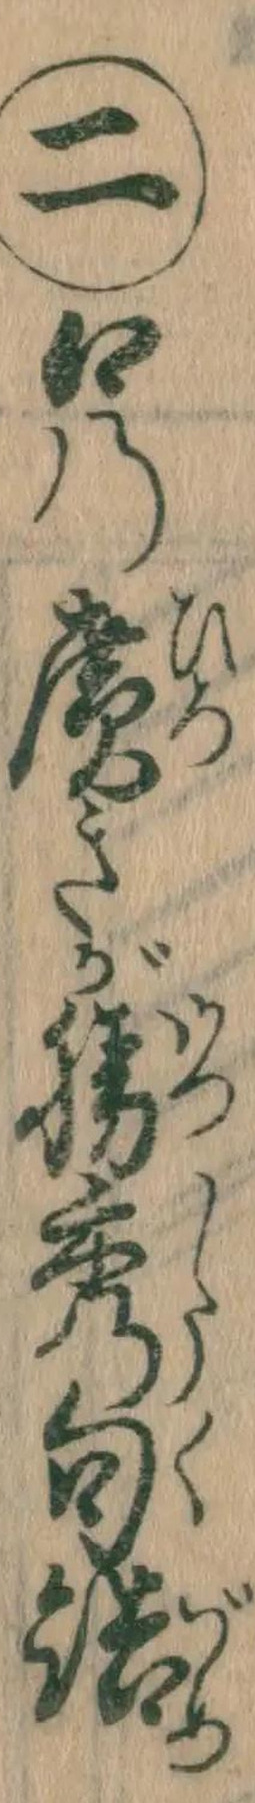二口の広きが勝秀句詰
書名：新竹斎 5巻
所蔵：国立国会図書館 National Diet Library, JAPAN
